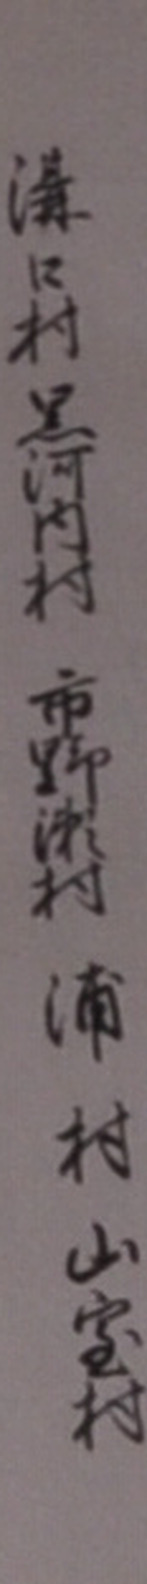溝口村黒河内村市野瀬村浦村山室村
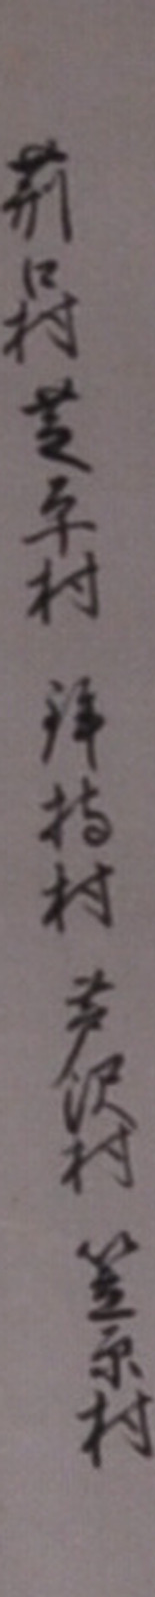荊口村芝平村鉾持村芦沢村笠原村
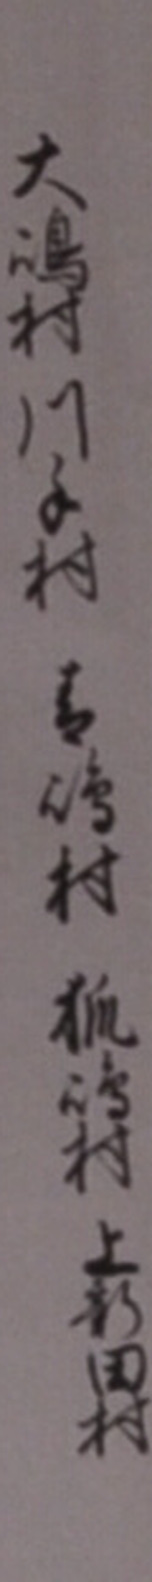大島村川手村青島村狐島村上新田村
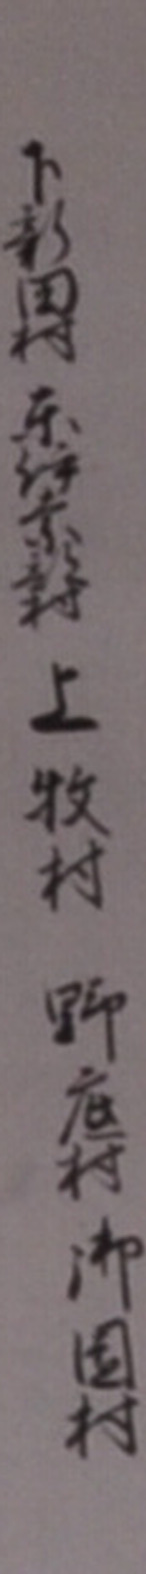下新田村東伊奈部村上牧村野底村御園村
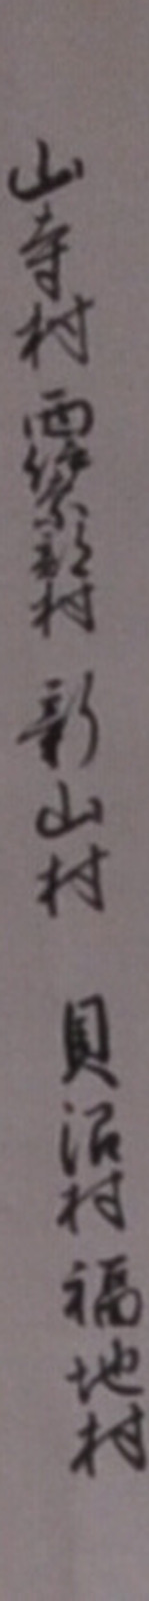山寺村西伊奈部村新山村貝沼村福地村
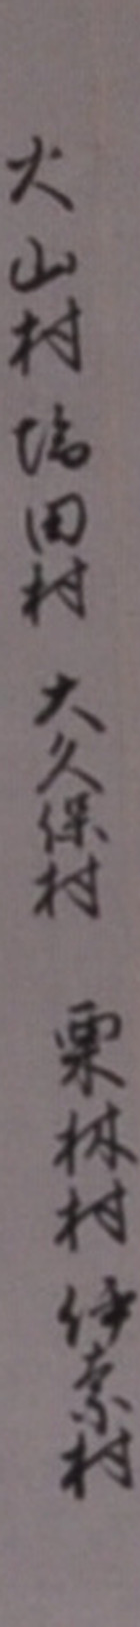火山村塩田村大久保村栗林村伊奈村
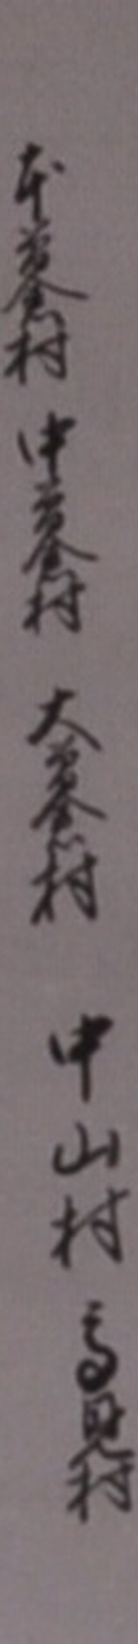本曽倉村中曽倉村大曽倉村中山村高見村
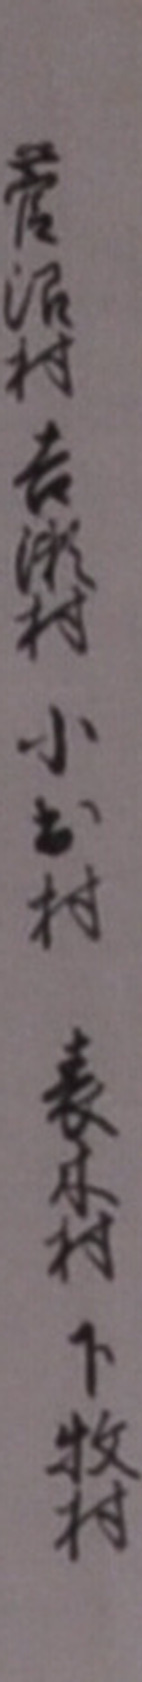菅沼村吉瀬村小出村表木村下牧村
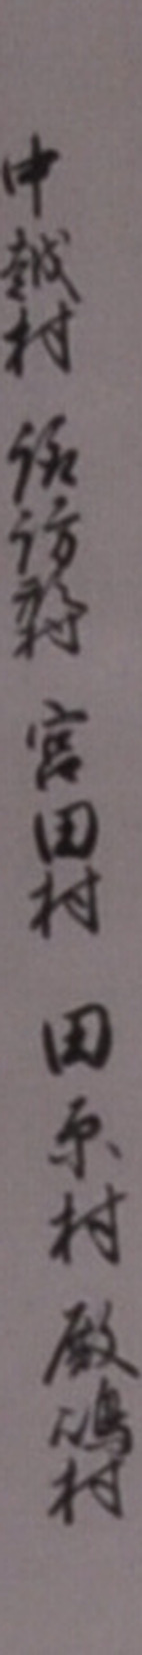中越村諏訪形村宮田村田原村殿島村
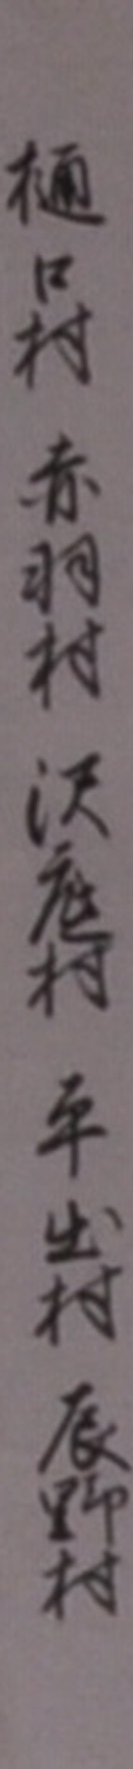樋口村赤羽村沢底村平出村辰野村
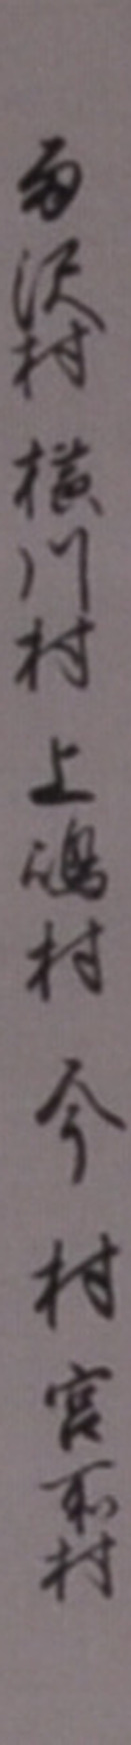雨沢村横川村上島村今村宮所村
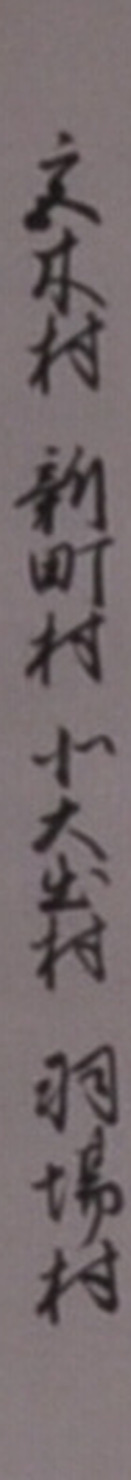宮木村新町村北大出村羽場村
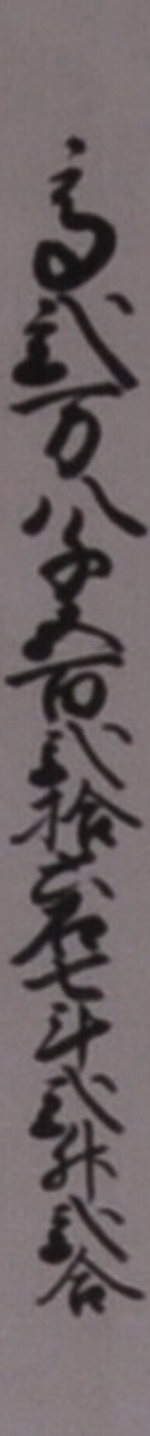高弐万八千五百弐拾六石七斗弐升弐合
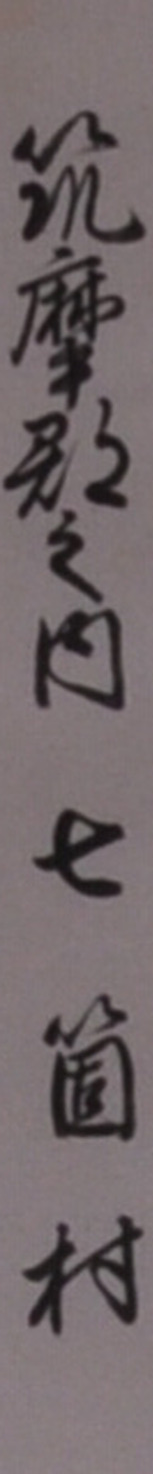筑摩郡之内七箇村
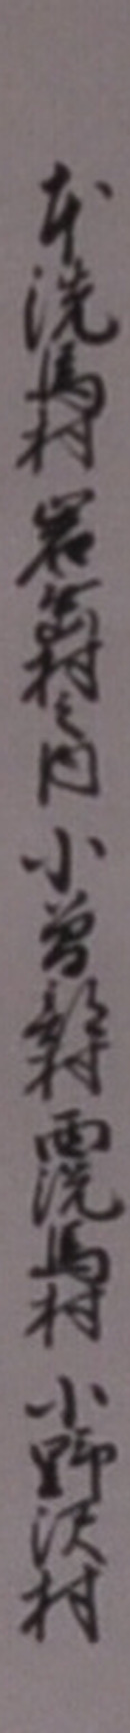本洗馬村岩垂村之内小曽部村西洗馬村小野沢村
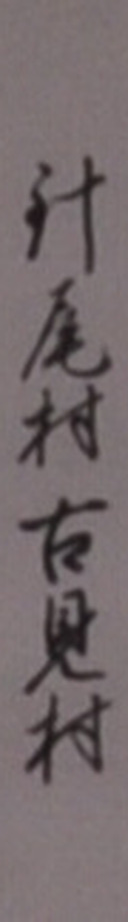針尾村古見村
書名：御朱印写・領地目録
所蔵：伊那市立高遠町図書館・合同会社AMANE
